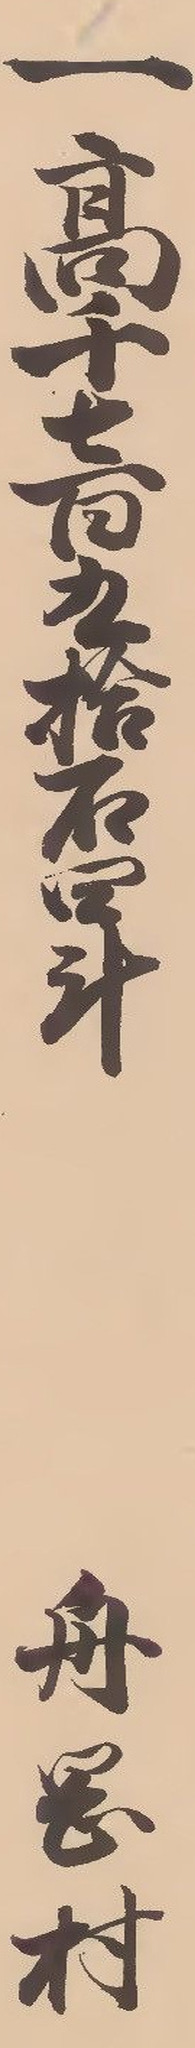一高千七百九拾石四斗舟岡村
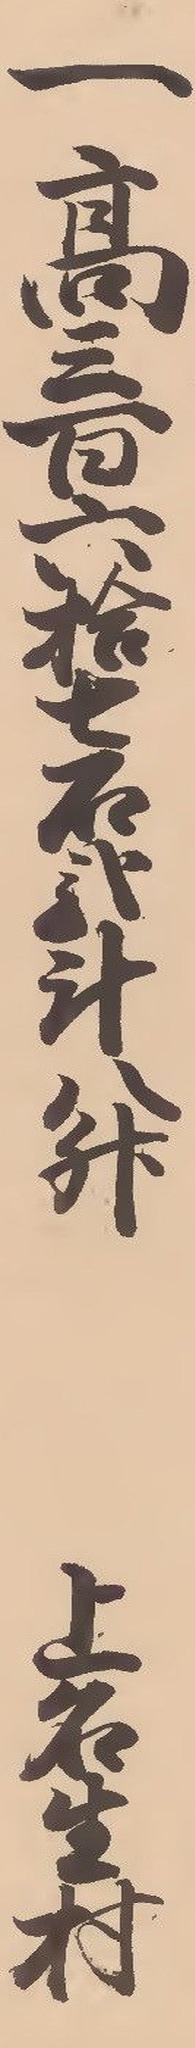一高三百六拾七石弐斗八升上名生村
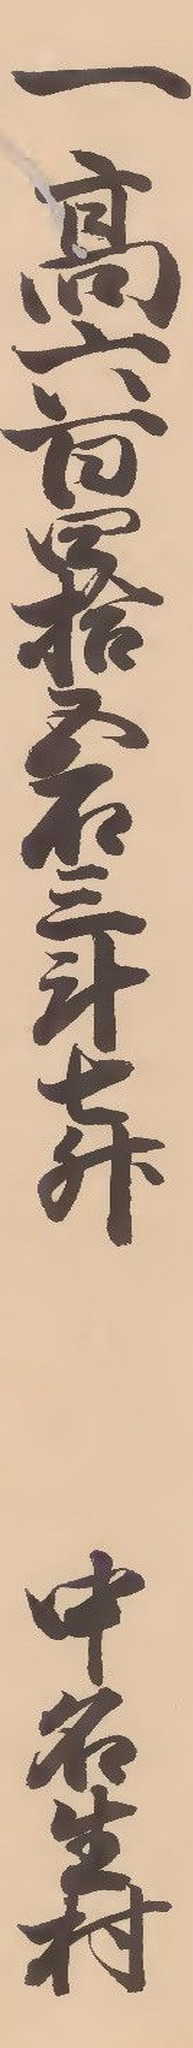一高六百四拾五石三斗七升中名生村

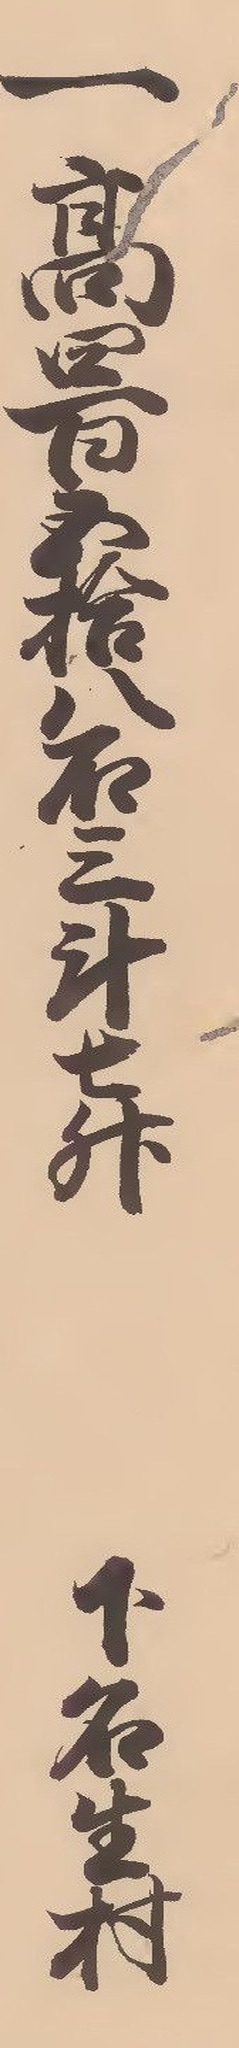一高四百五拾八石三斗七升下名生村
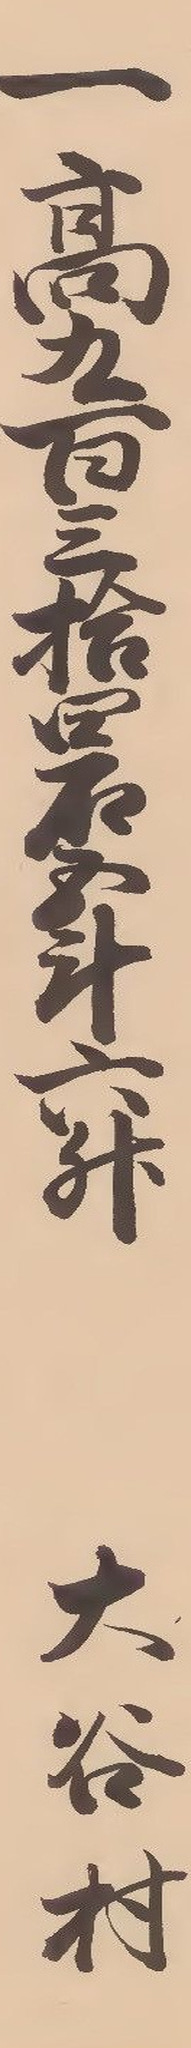一高九百三拾四石五斗六升大谷村
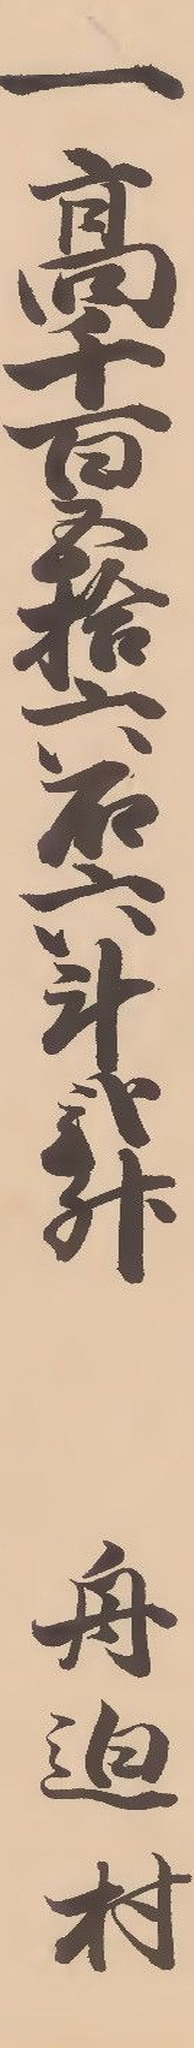一高千百五拾六石六斗弐升舟迫村
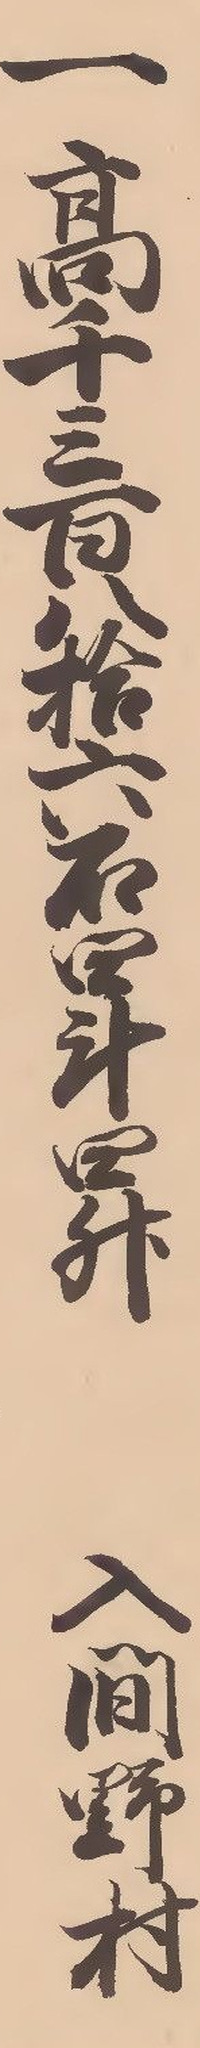一高千三百八拾六石四斗四升入間野村
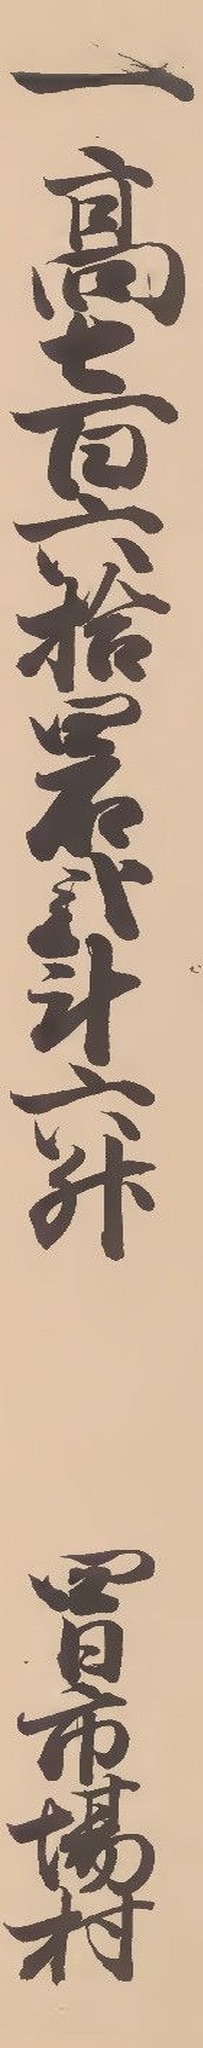一高七百六拾四石弐斗六升四日市場村
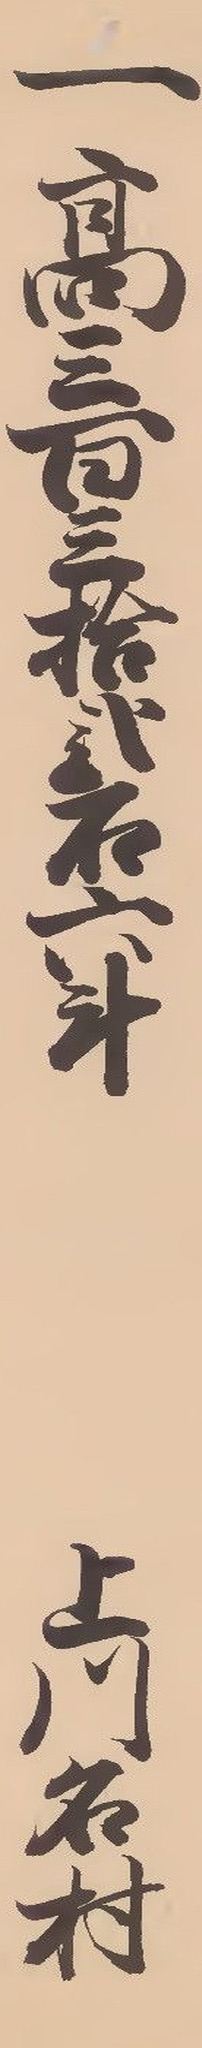一高三百三拾弐石六斗上川名村
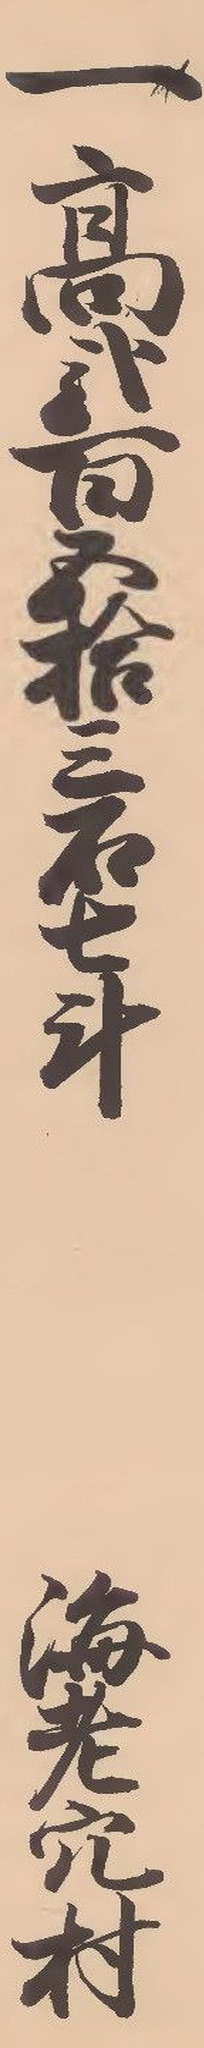一高弐百五拾三石七斗海老穴村
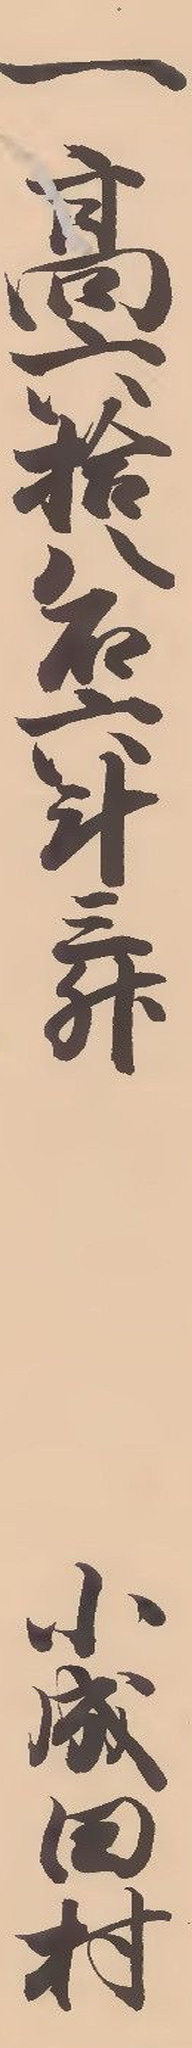一高六拾八石六斗三升小成田村

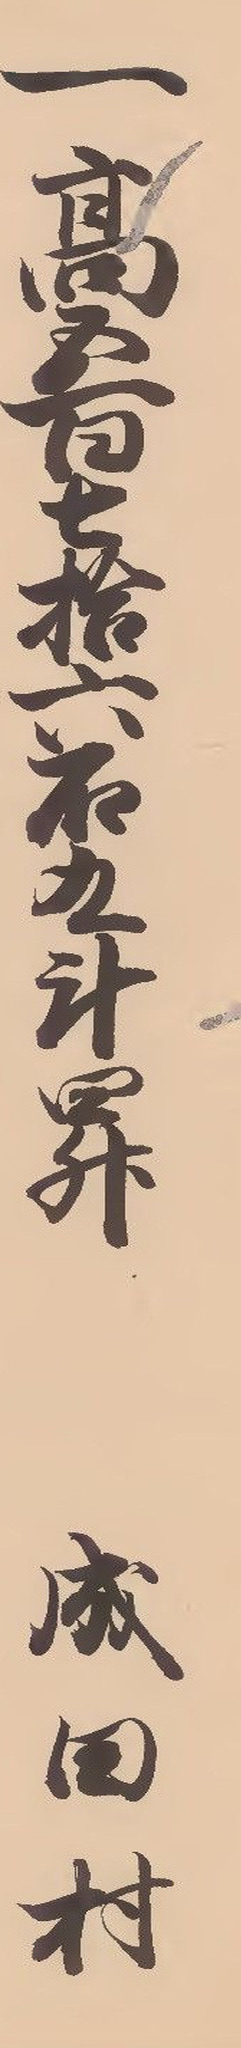一高五百七拾六石九斗四升成田村
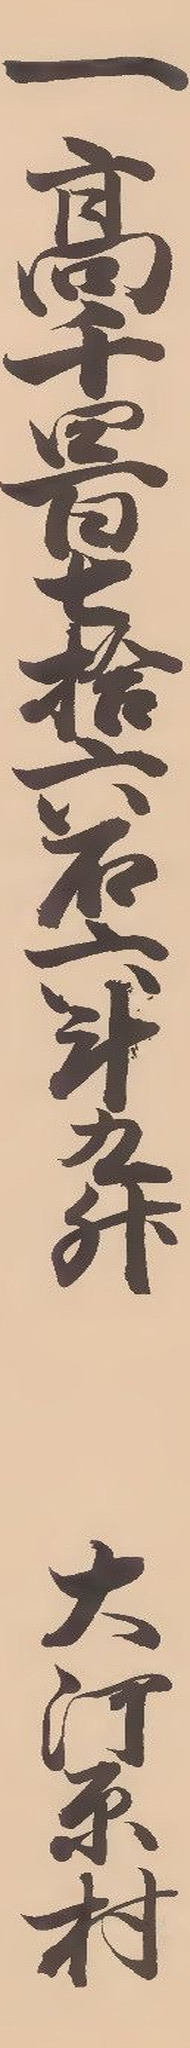一高千四百七拾六石六斗九升大河原村
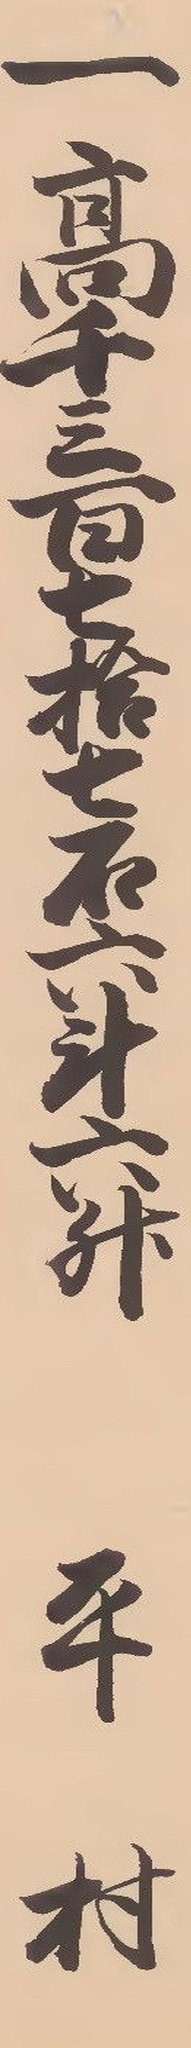一高千三百七拾七石六斗六升平村
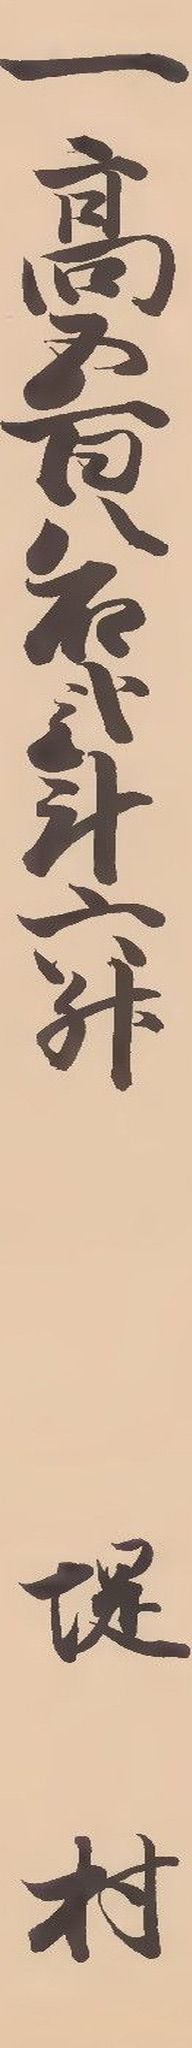一高五百八石弐斗六升堤村
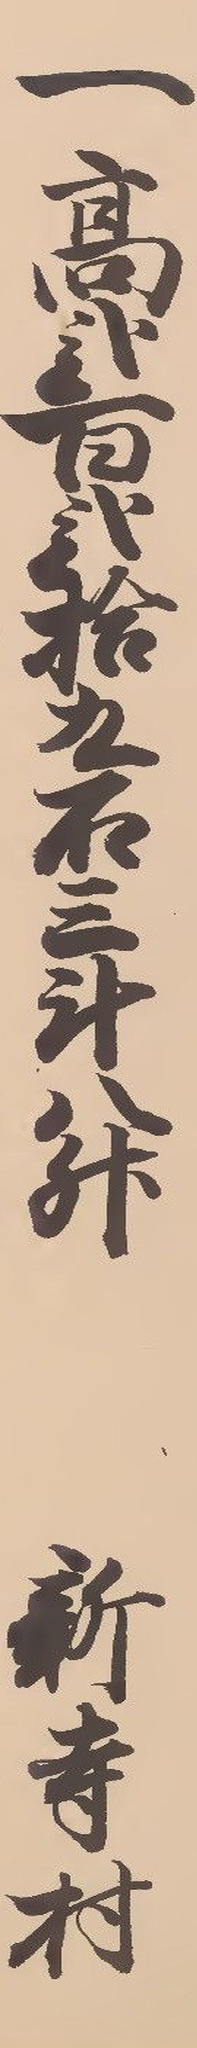一高弐百弐拾九石三斗八升新寺村
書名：陸奥国郷帳　５
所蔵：国立公文書館 National Archives of Japan
